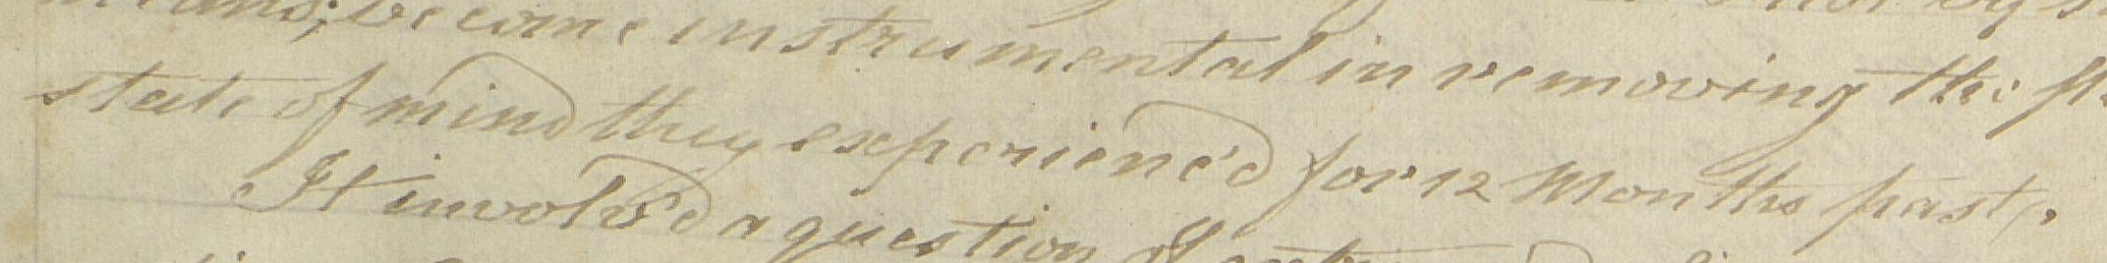state of mind they experienc'd for 12 month past.
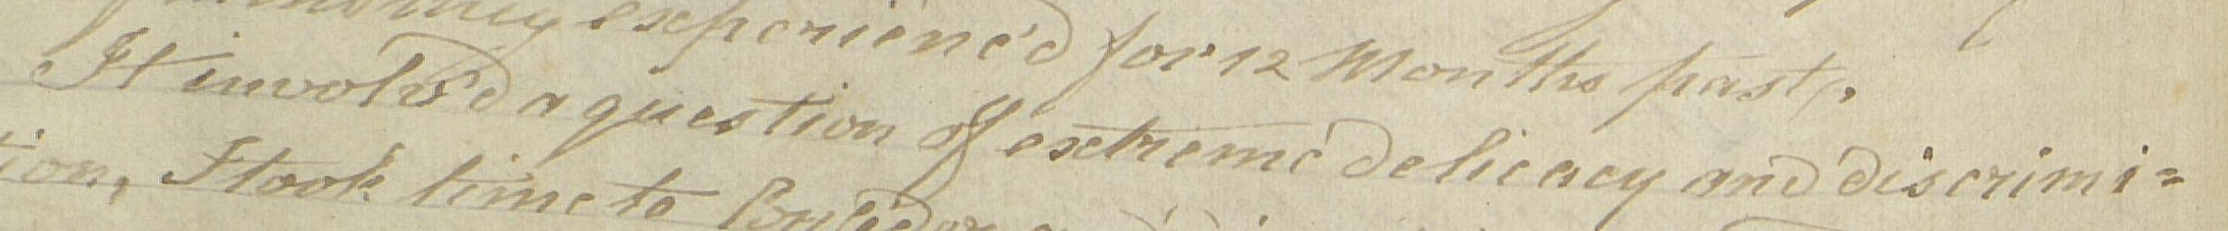It involv'd a question of extreme delicacy and discrimi-
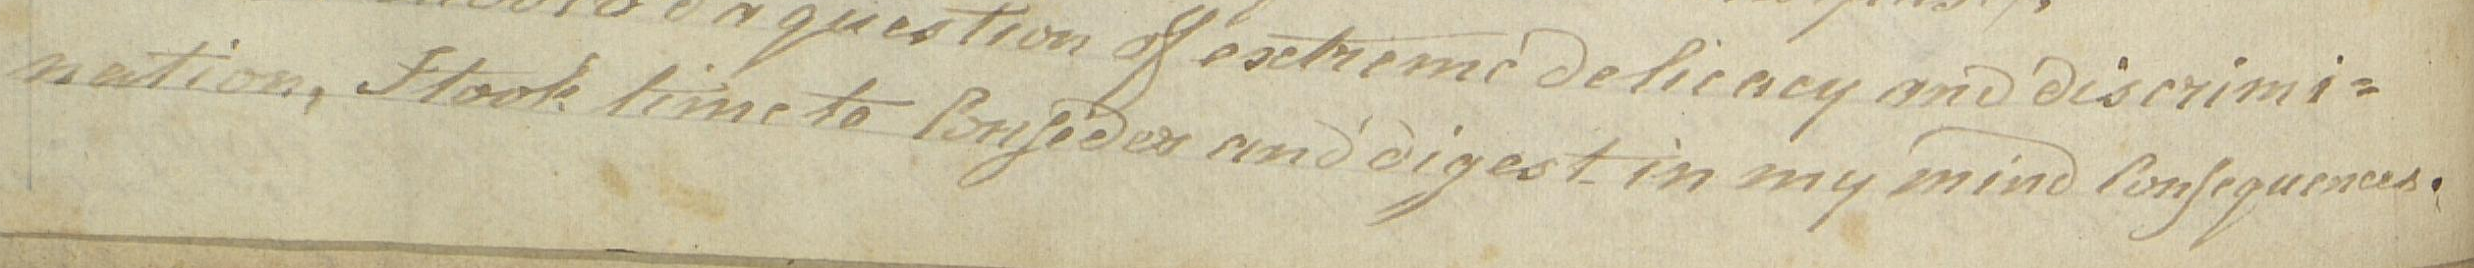nation, I took time to Consider and digest in my mind Consequences.
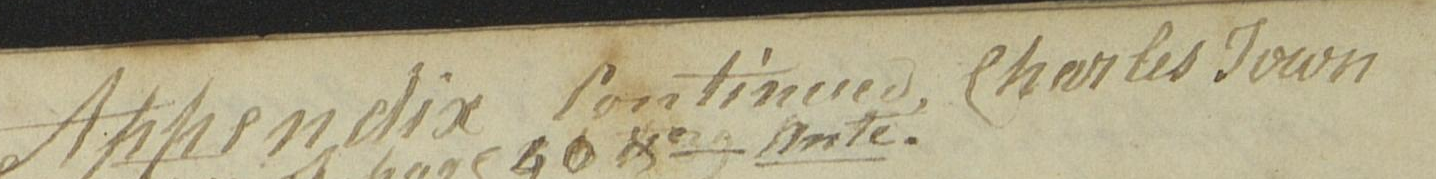Appendix continued, Charles Town
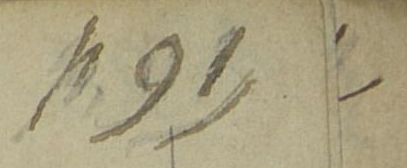p 91
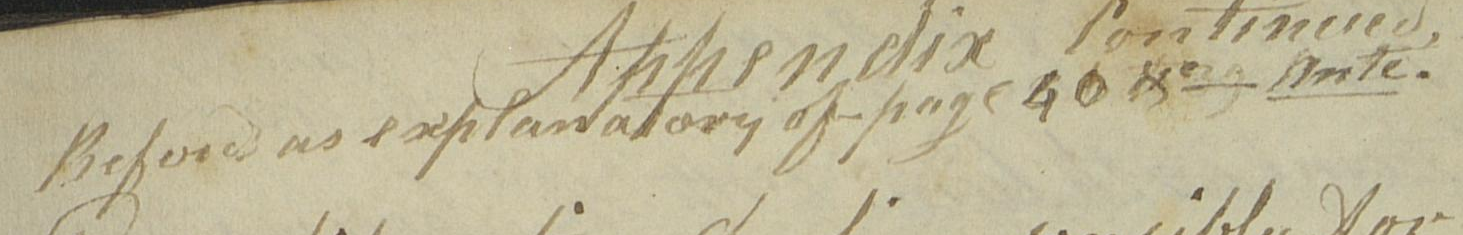Before as explanatory of page 40 &^c Ante.
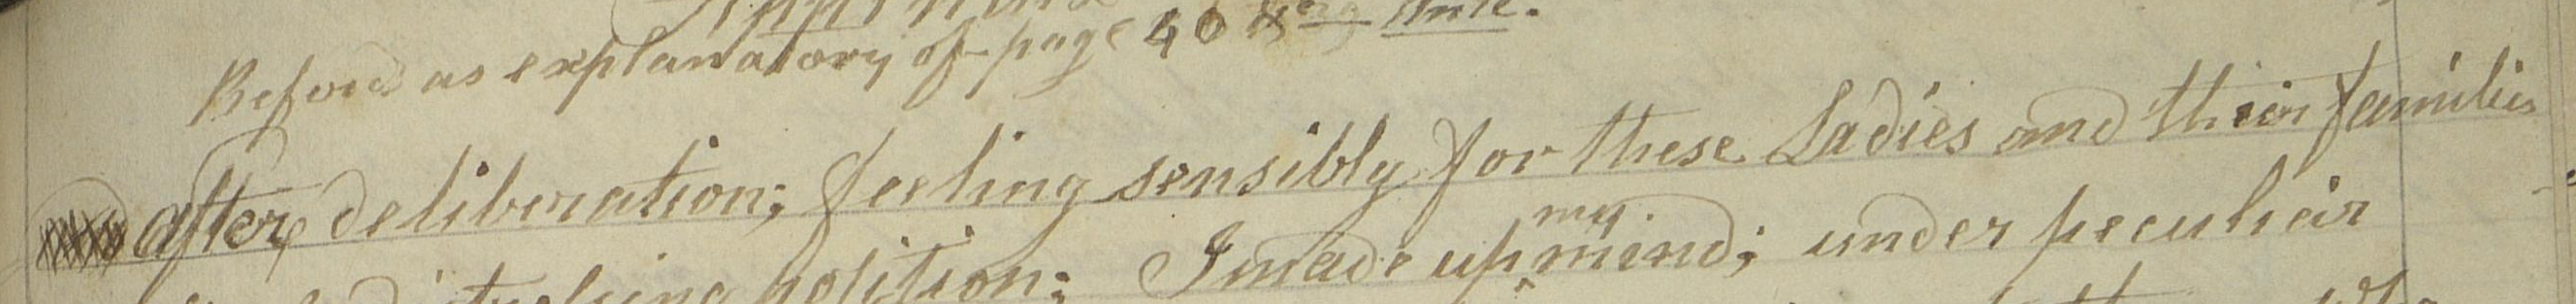[and] after deliberation; feeling sensibly for these Ladies and their familiar
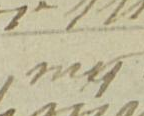my
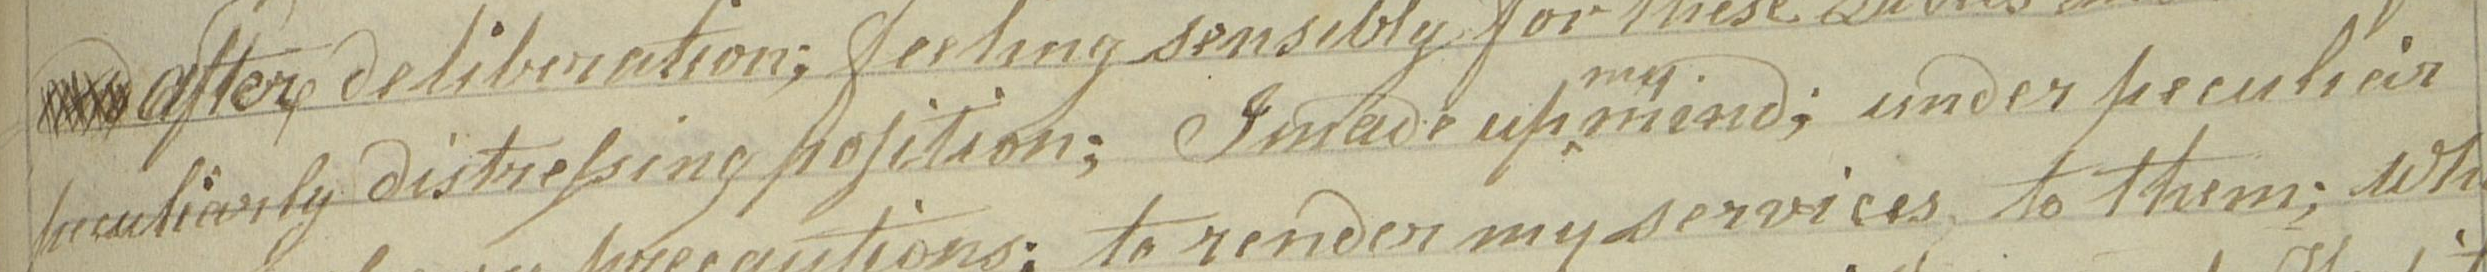peculiarly distressing position; I made up ^ mind; under peculiar
